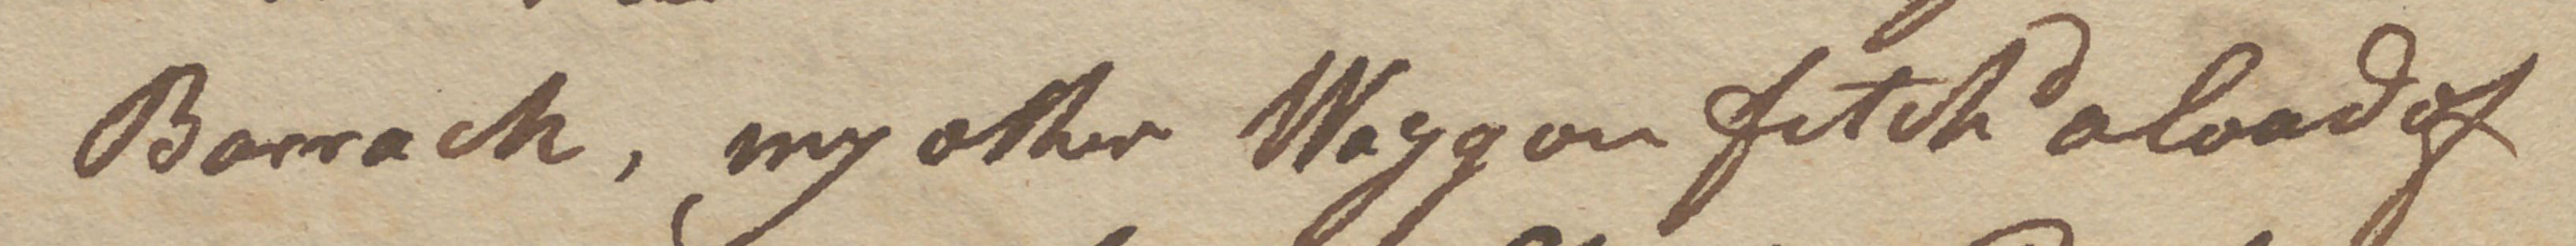Barrack, my other Waggon fetch^d a load of
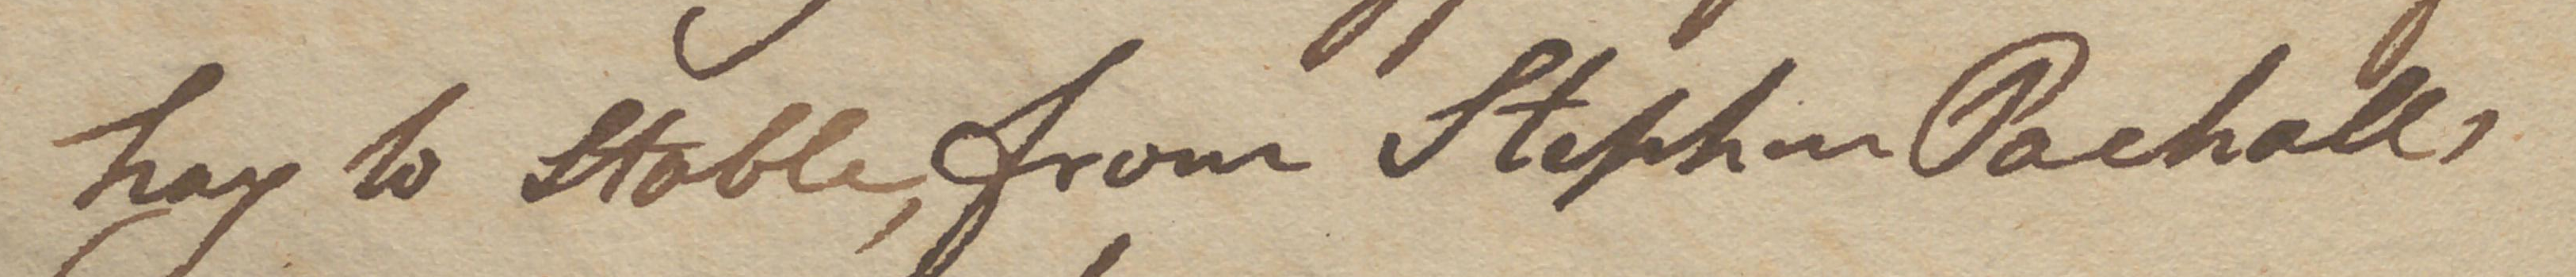hay to Stable, from Stephen Pachalls
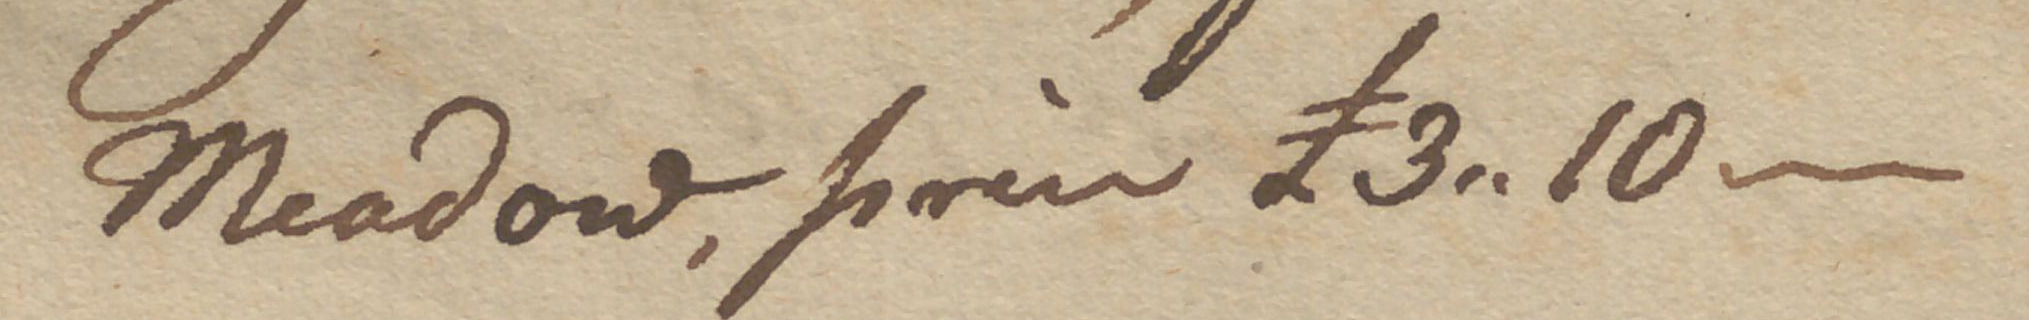Meadow, price £3..10-
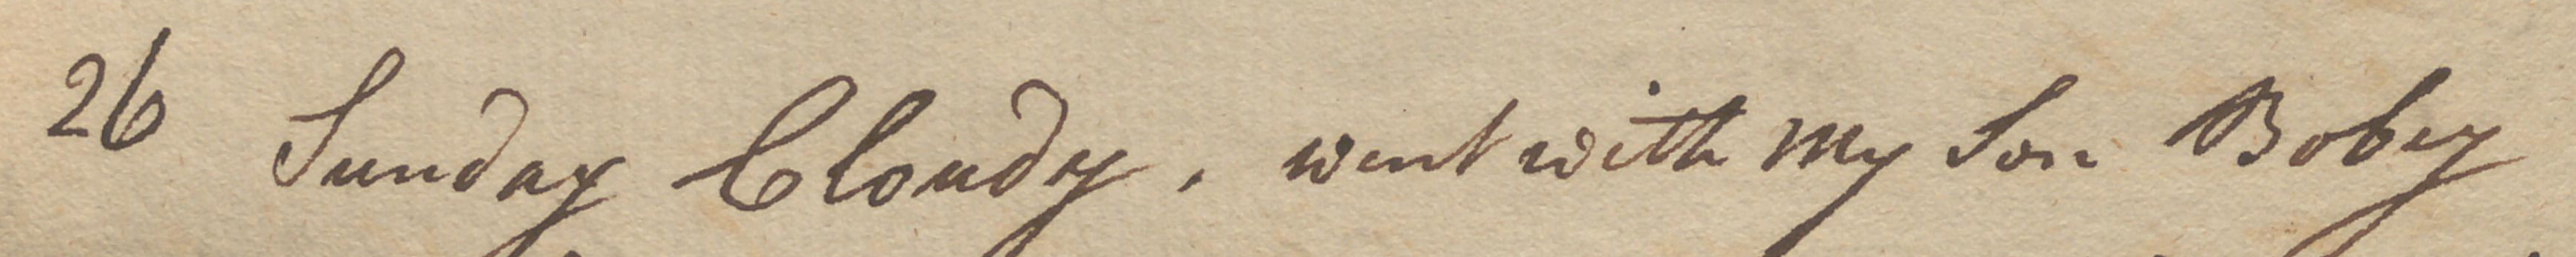26 Sunday Cloudy, went with My Son Bobey
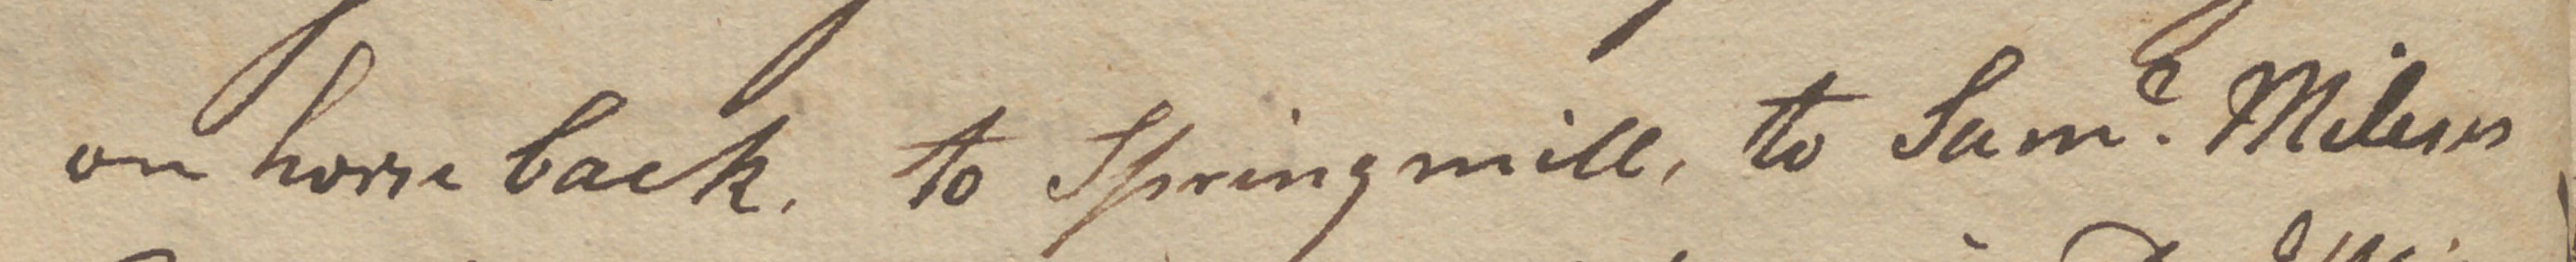on horse back. to Springmill, to Sam^l. Mileses
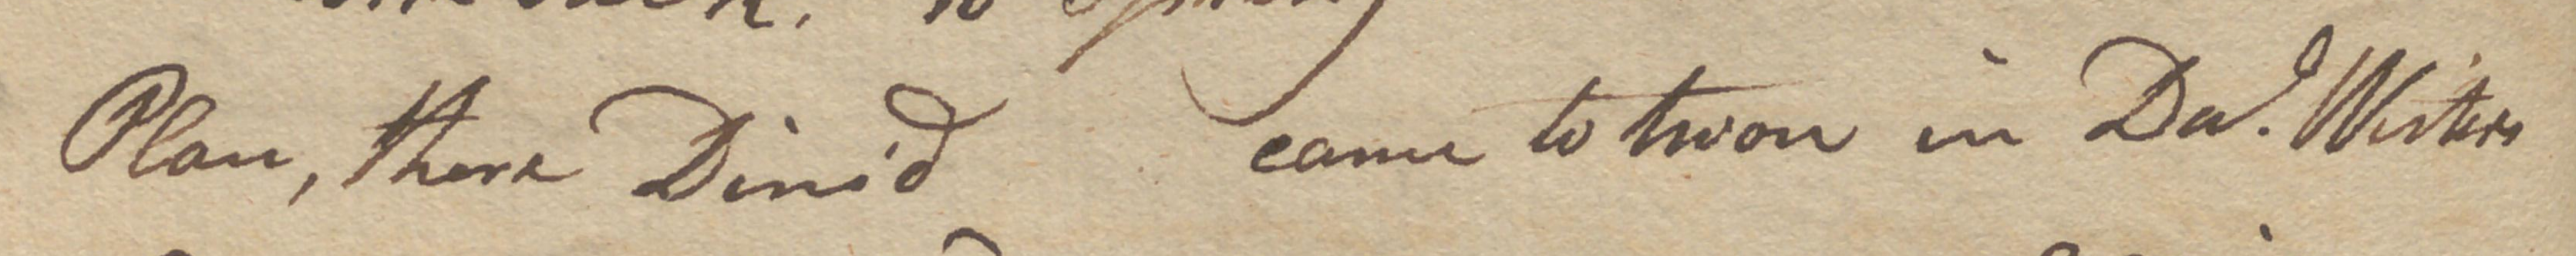Plan, there Dined came to twon in Da^l. Wisters
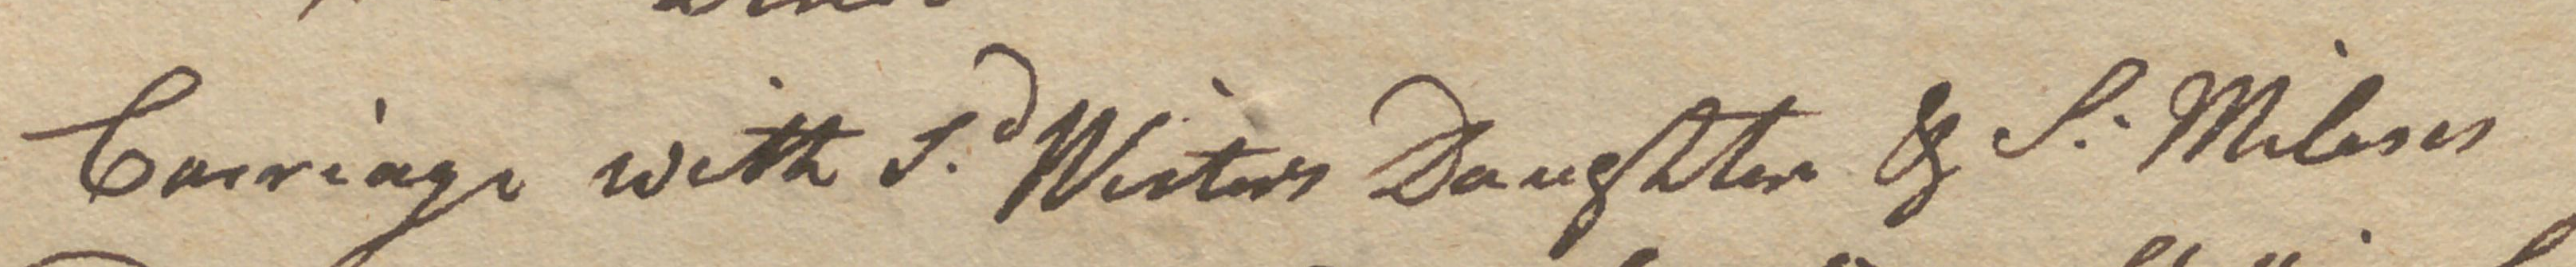Carriage with s^d. Wisters Daughter & S^d. Mileses
